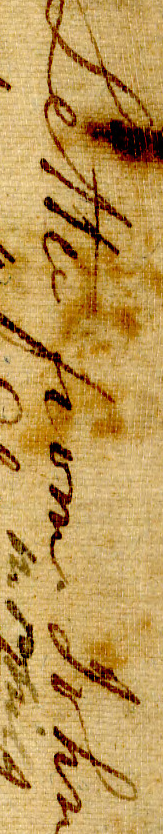Letter from John
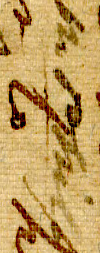in Phila
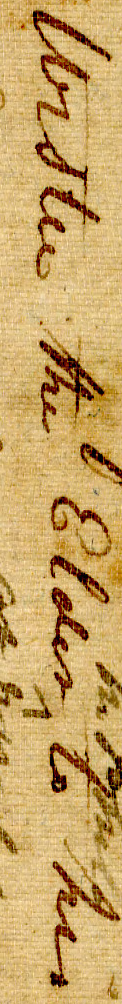Wister the Elder ^ to his
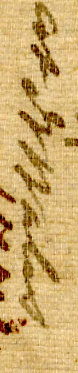at N Wales
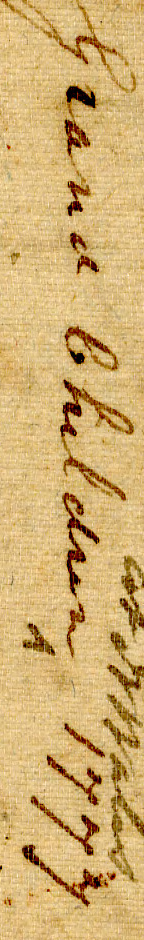Grand children ^ 1777
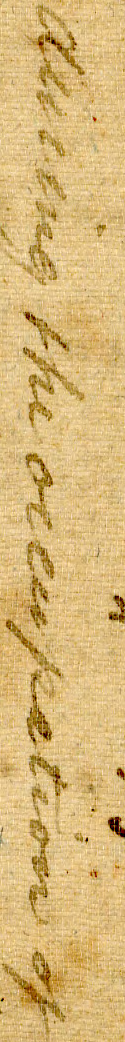during the occupation of
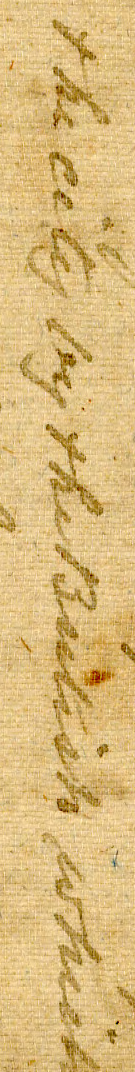the city by the British which
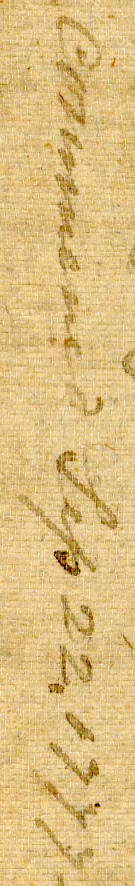commenced Sep 22. 1777
